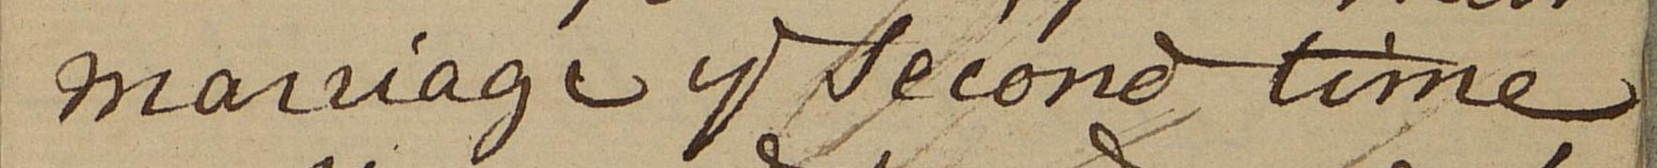marriage y^e second time
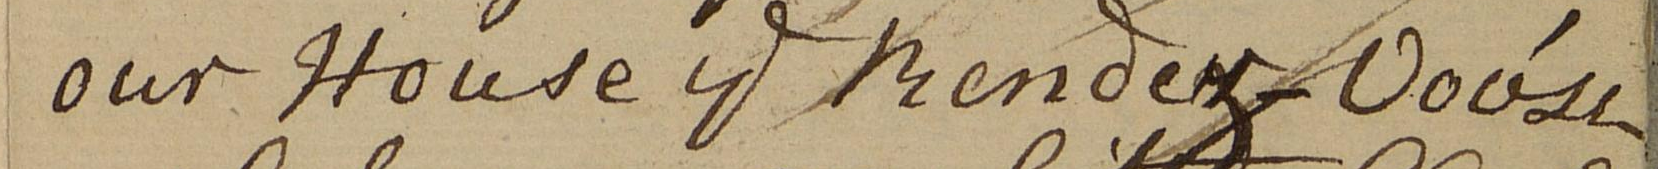our House y^e Rendez-Vouse
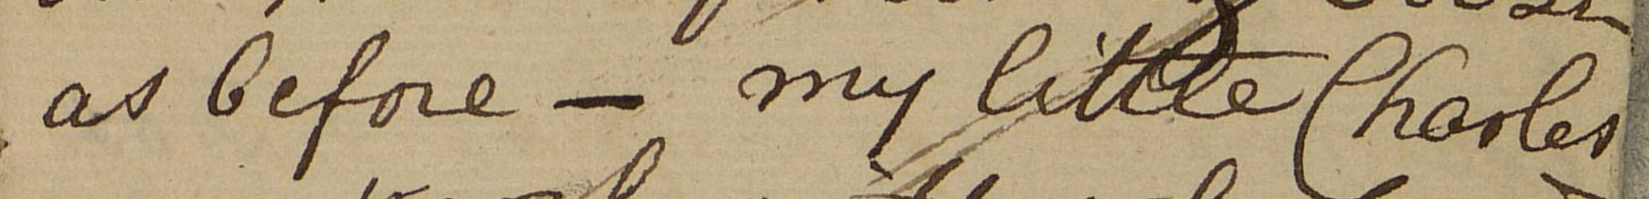as before- my little Charles
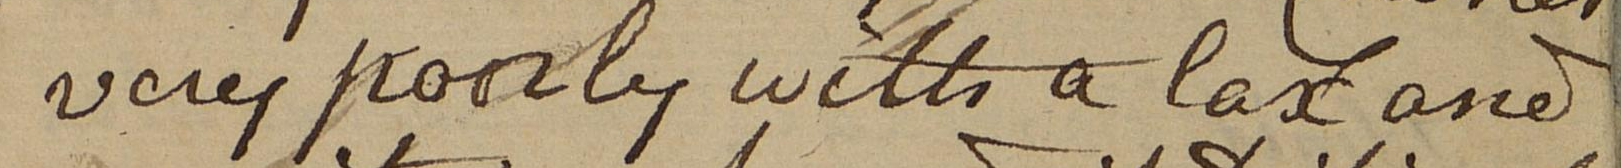very poorly with a lax and
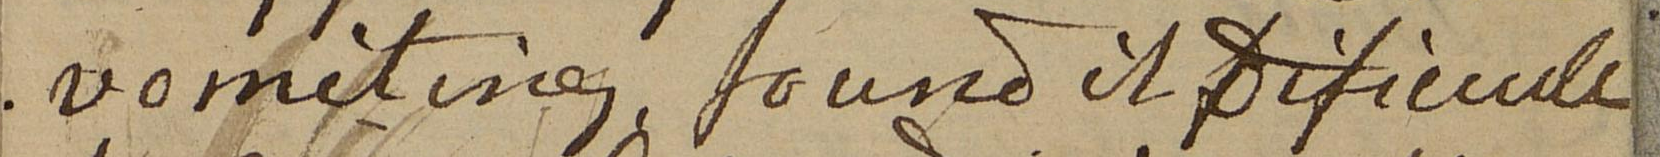vomiting, found it Dificult
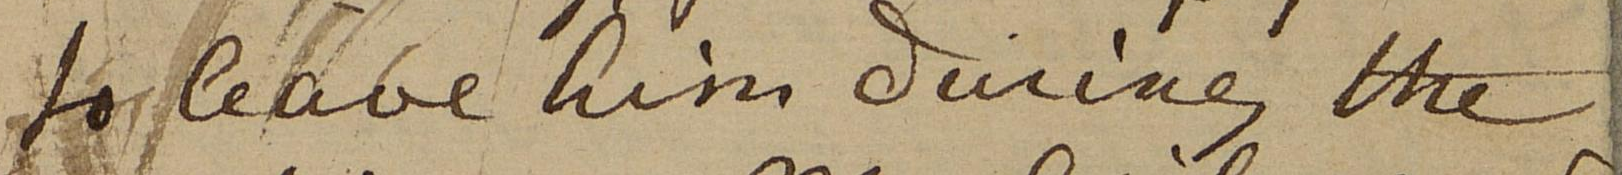to leave him during, the
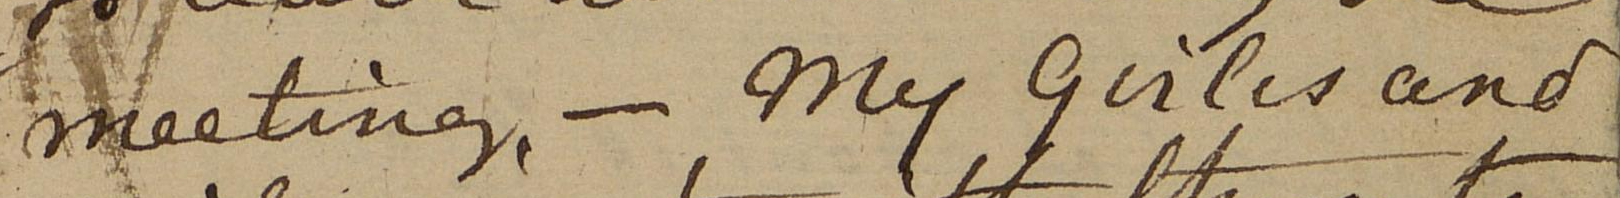meeting,- My Girles and
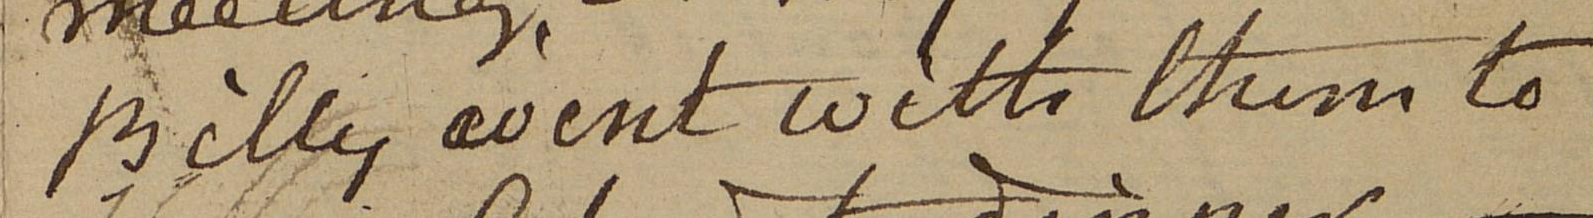Billy went with them to
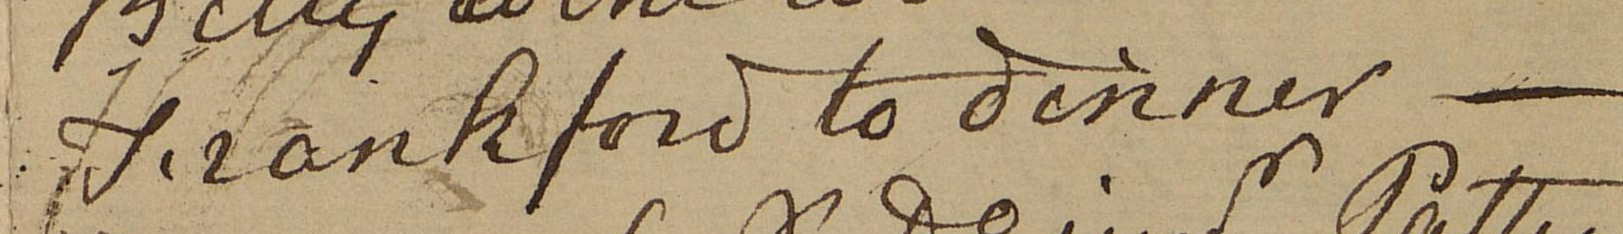Frankford to dinner-
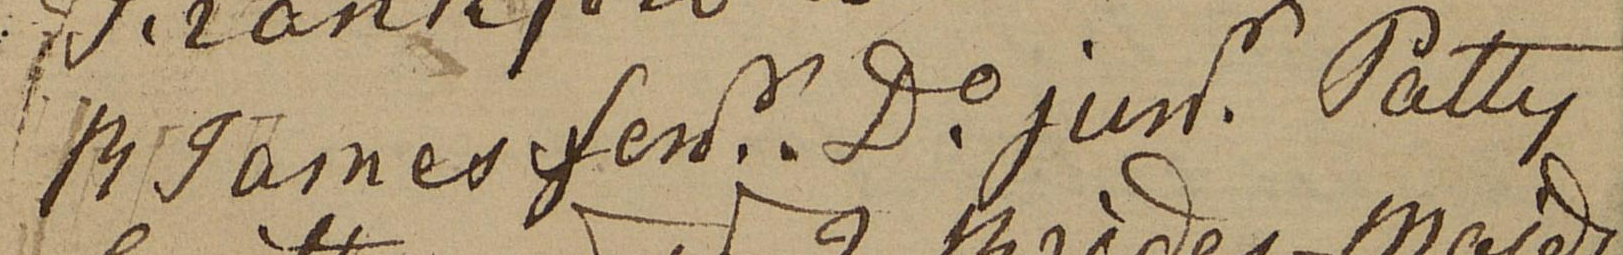R James Sen^r. D^o. jun^r. Patty
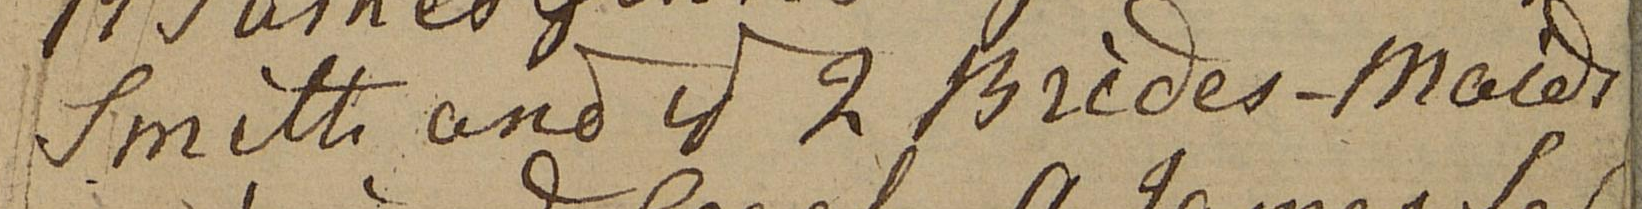Smith and y^e 2 Brides- Maids
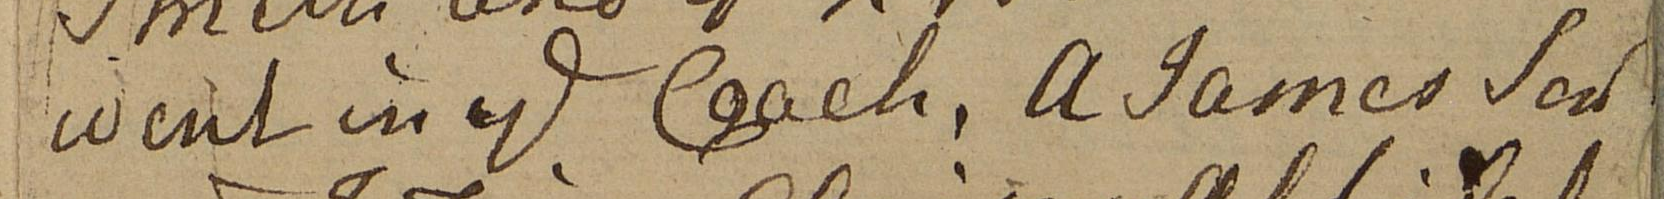went in y^e Coach, A James Sen^r
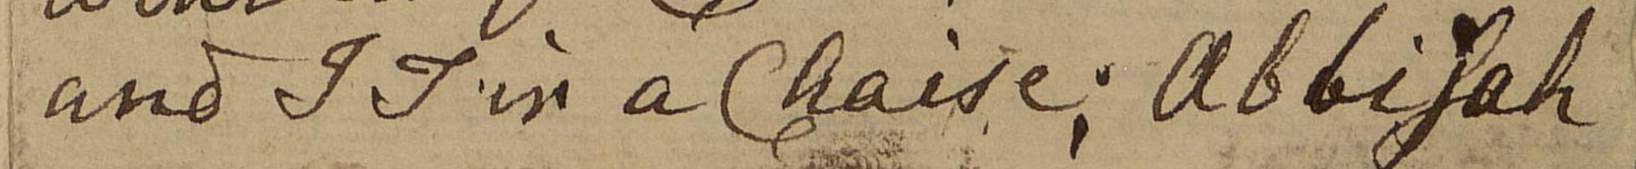and JJ in a Chaise; Abbisah
